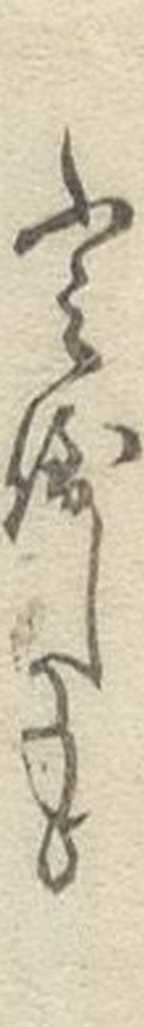ふみ倒しにも
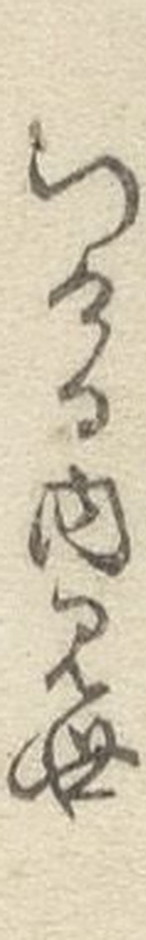いける内見世
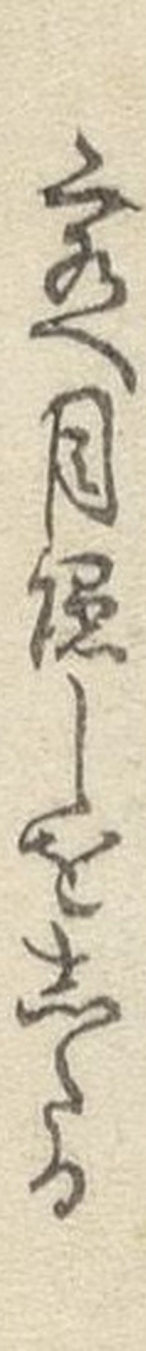客へ目隠しをしたる道草
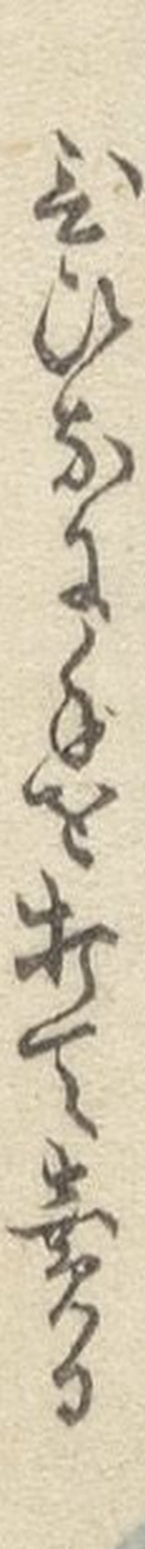ひひなに手を打て売る
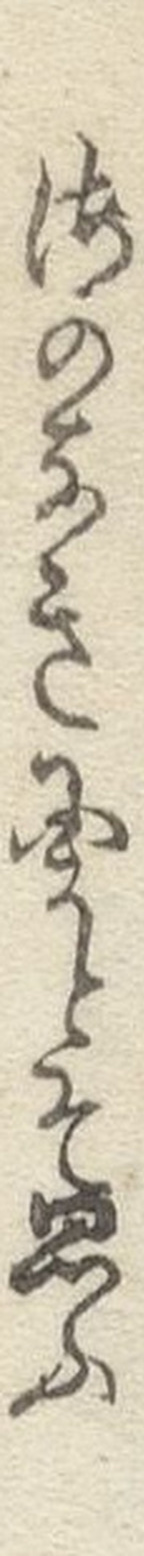海のなき国かとそ思ふ
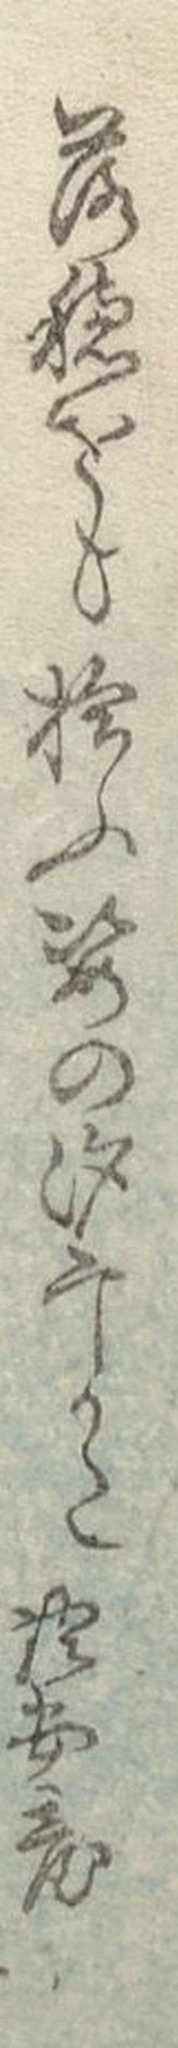落穂をも拾ふ姿の汐干かた語安台
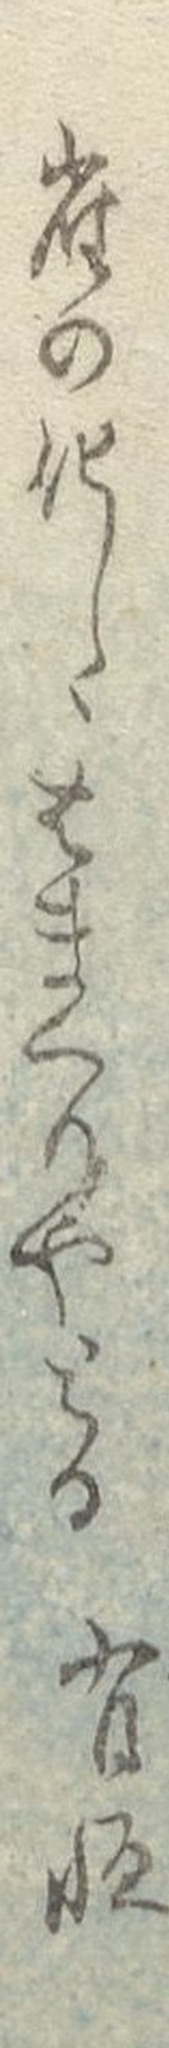雀の化したはまくりやとる有恒
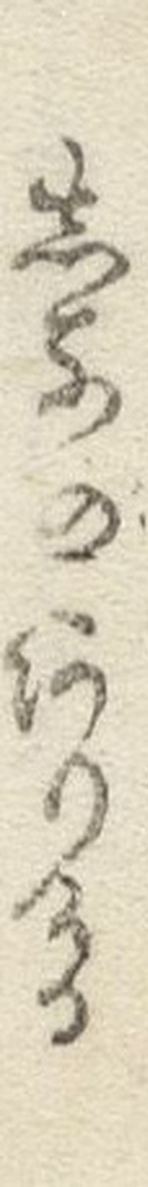しなのありける喜樽
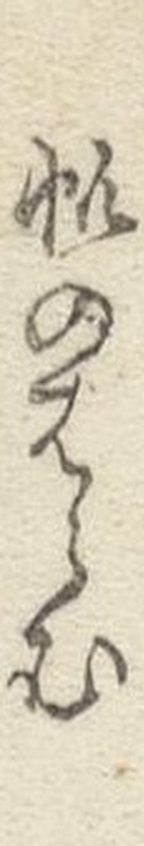帆のはらむ
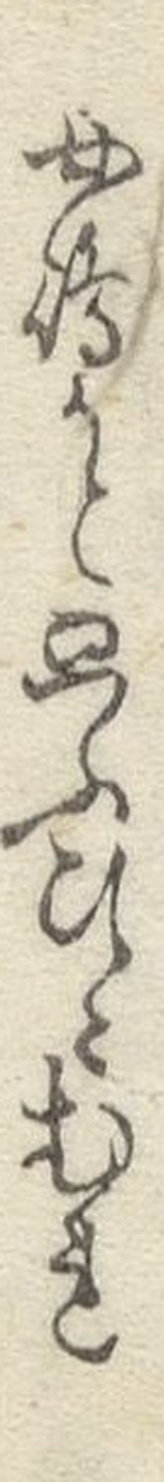女嶋うと思ふひとむれ
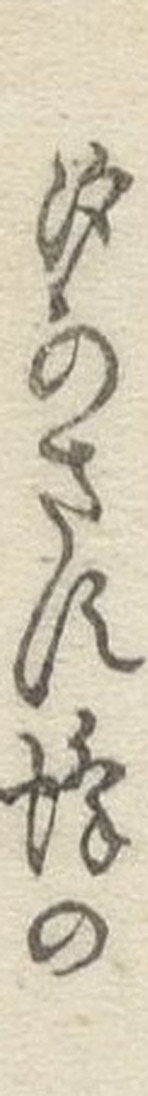汐のさす蜂の
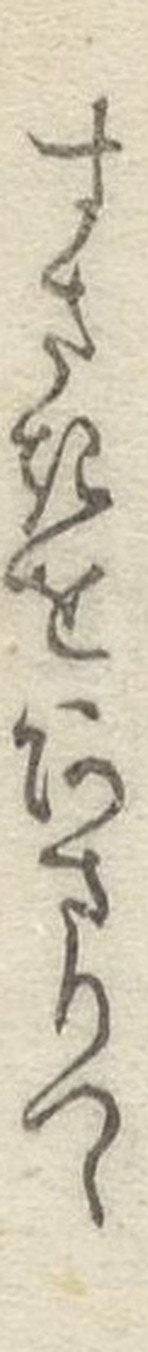すさきをあさりつゝ
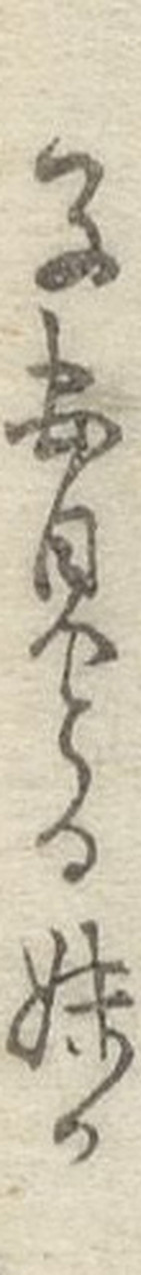子安貝とる妹か
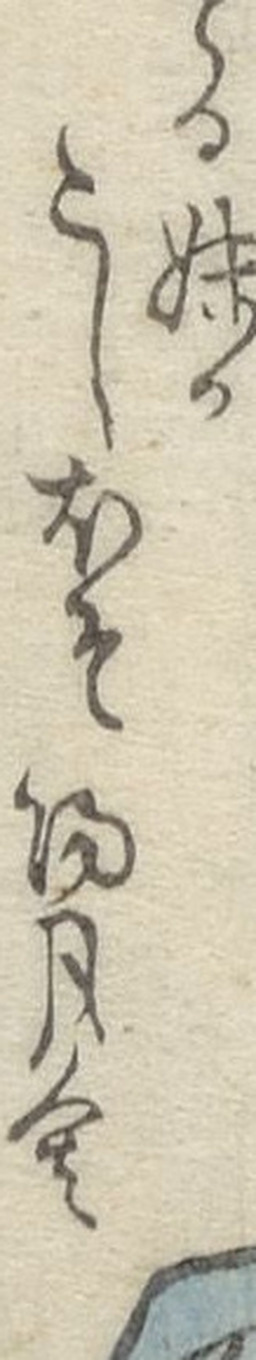こしほそ陽月舎
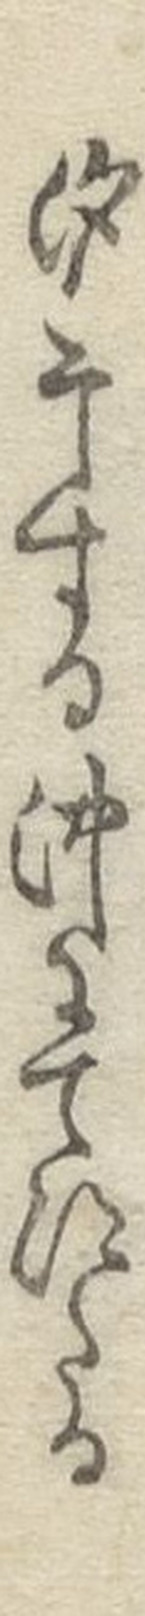汐干する沖にて得たる
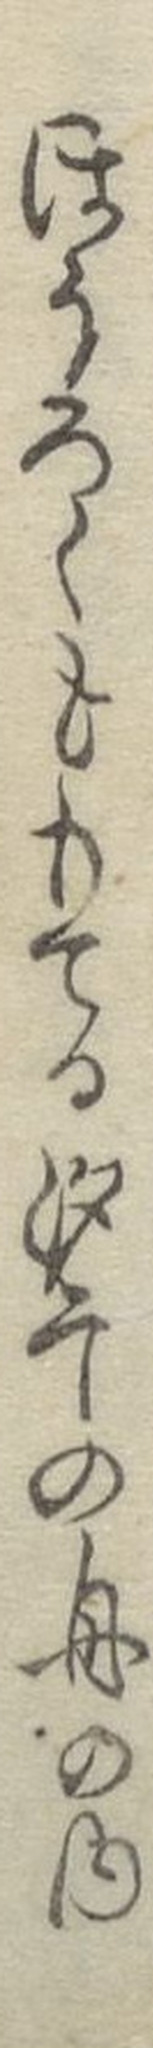ほうろくももてる汐干の舟の内
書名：Picture Album of People with Kyōka (Light Verse) (Kyōka shiki jinbutsu 狂歌四季人物)
